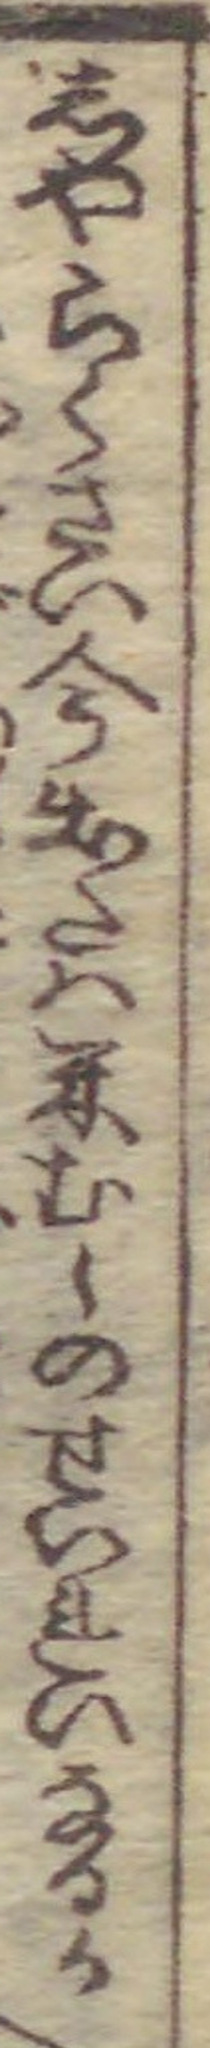しやらくさい今出たは米むしのせいれいなるか
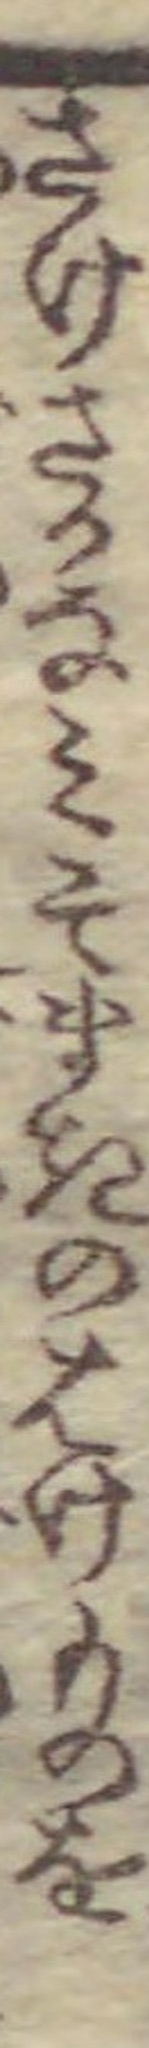さけさかなみそまきのはけものを
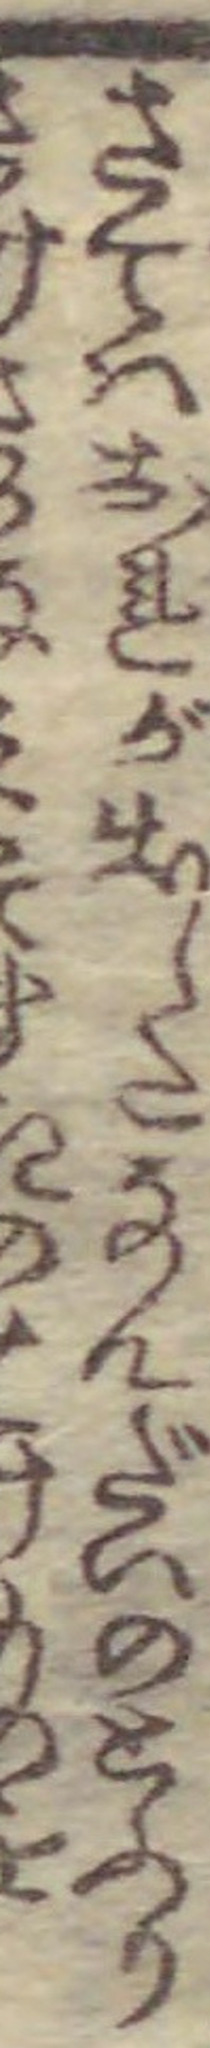さけさかなみそまきのはけものを
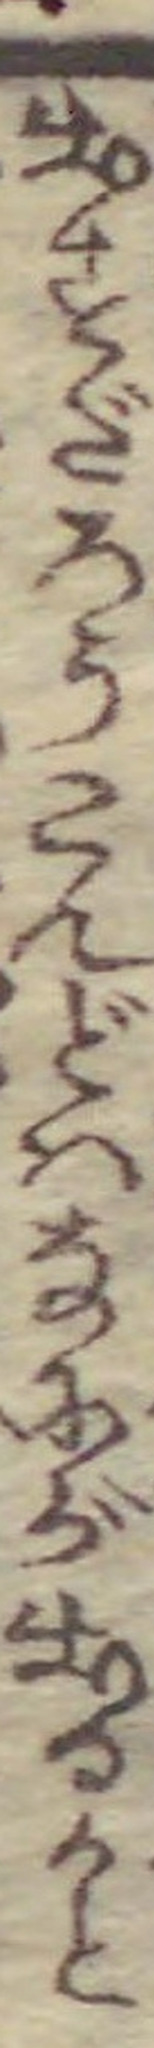出すだろうこんどはなにが出るかと
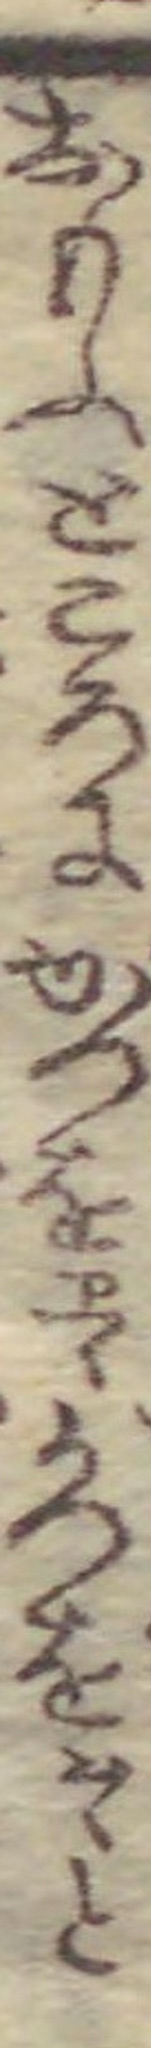おもふところにかつをヱヽかつをヱヽと
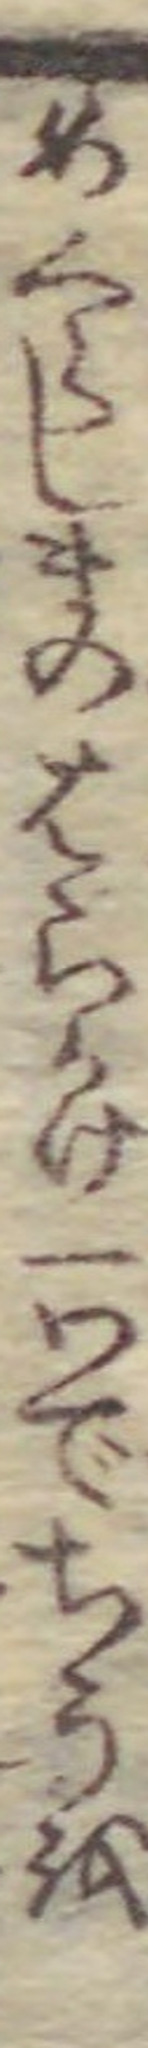めくらしまのはらかけ一つでちうを
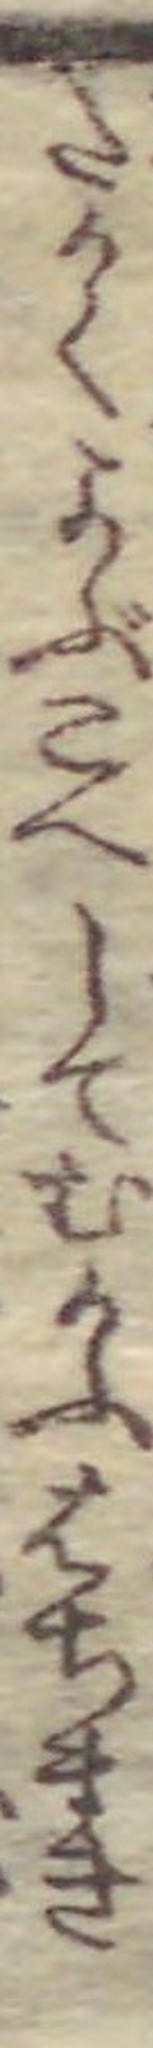たかくよぶこへしてむかふはちまき
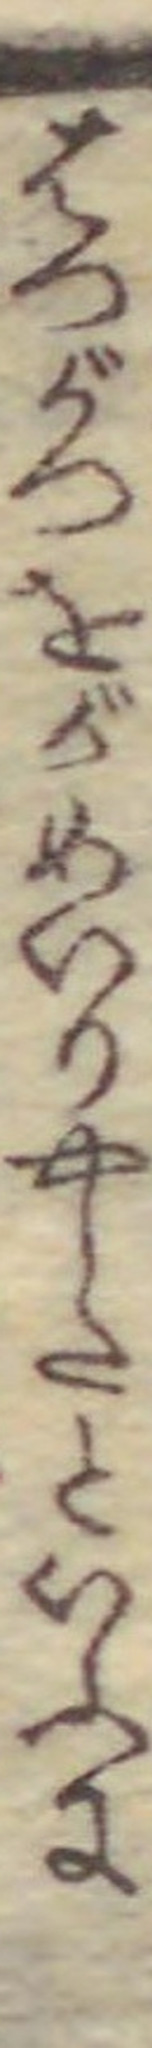はつがつをがめいりやしたといふに
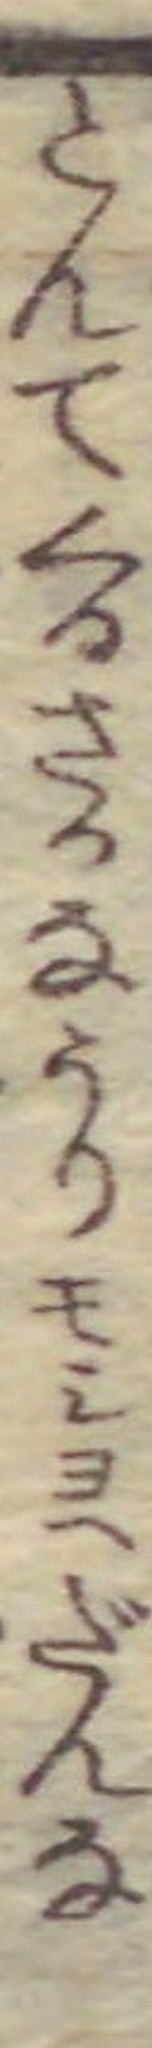とんてくるさかなうりモシヨヘだんな
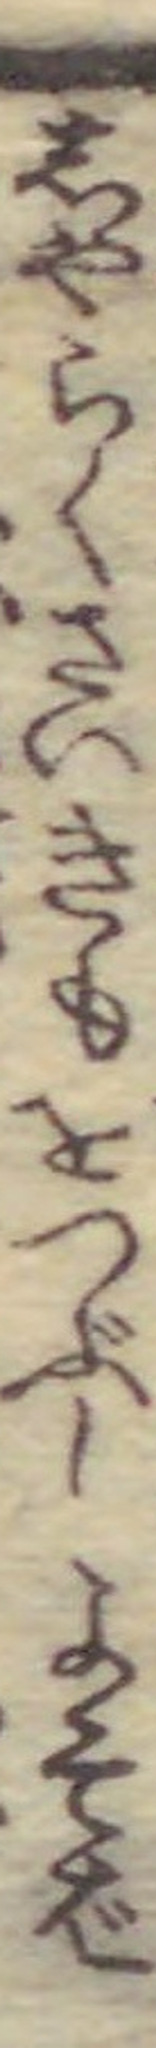しやらくさいきもをつぶしよそば
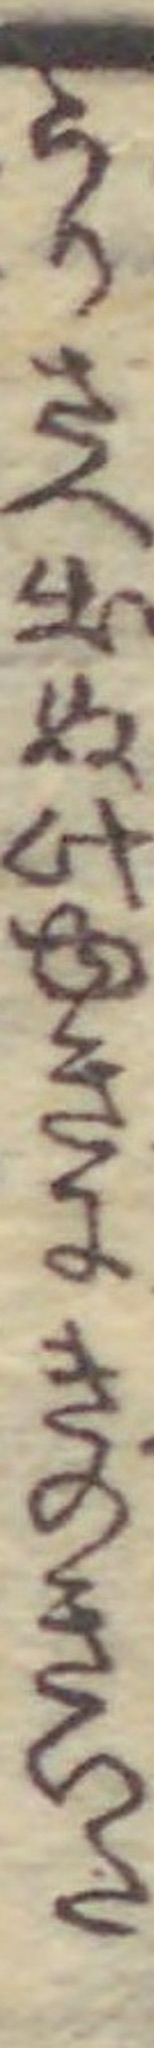うりさへ出ぬ此ゆきにきのきいた
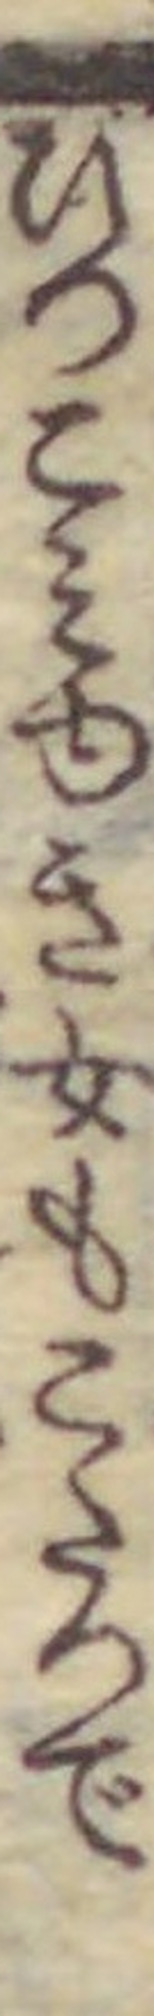ひつこみゆき女もこたつで
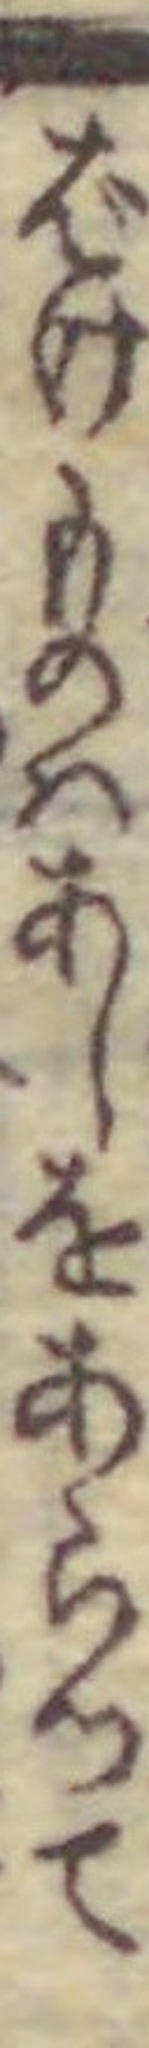ばけものはあしをあらつて
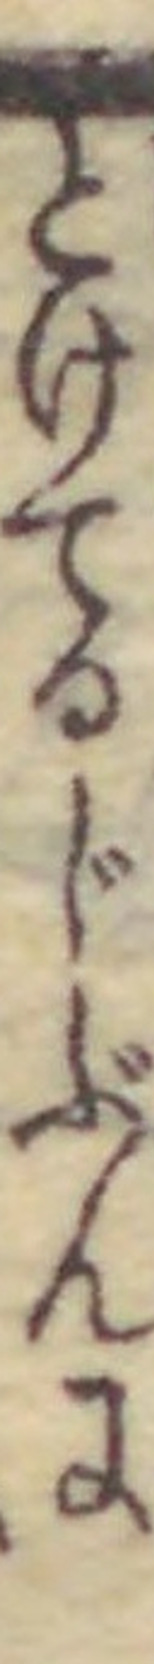とけてるじぶんに
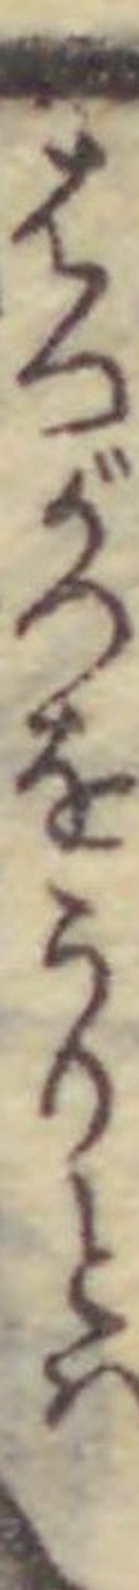はつがつをうりとは
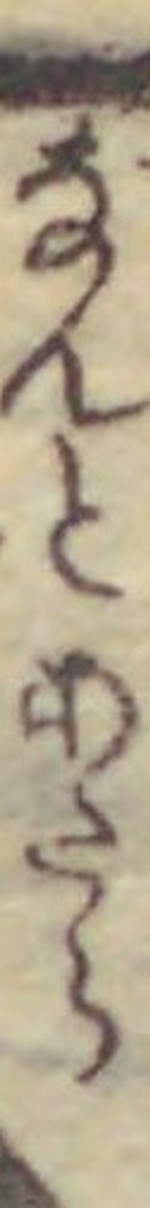なんとあたら
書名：大時代唐土化物 3巻. 曽我太夫染
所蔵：国立国会図書館 National Diet Library, JAPAN
